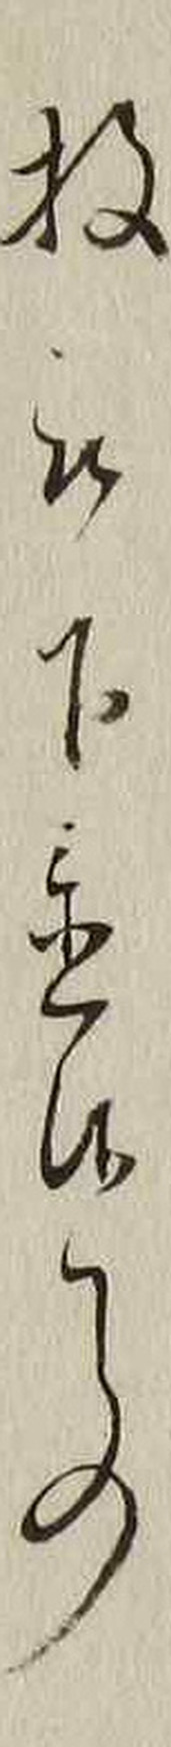枚被下置候事
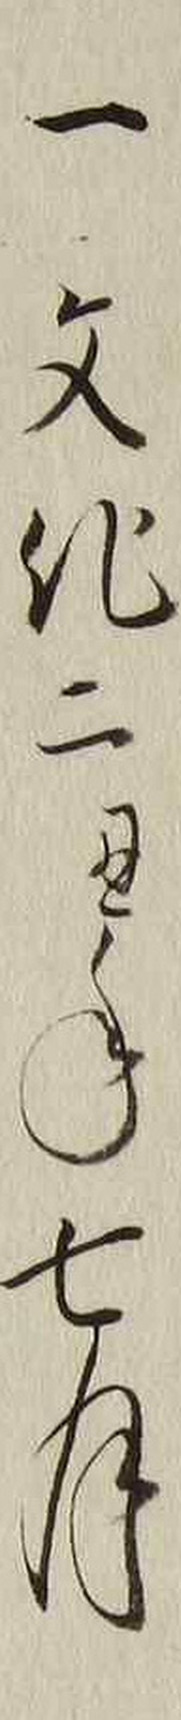一文化二丑年七月
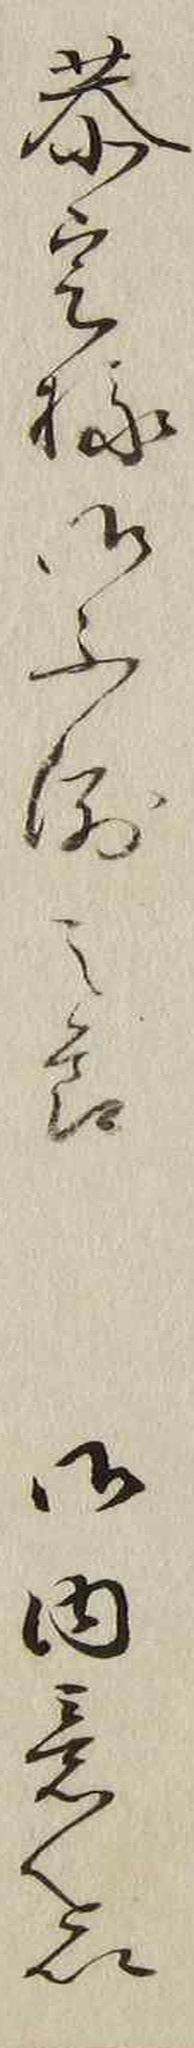恭定様御不例之節御内意を以
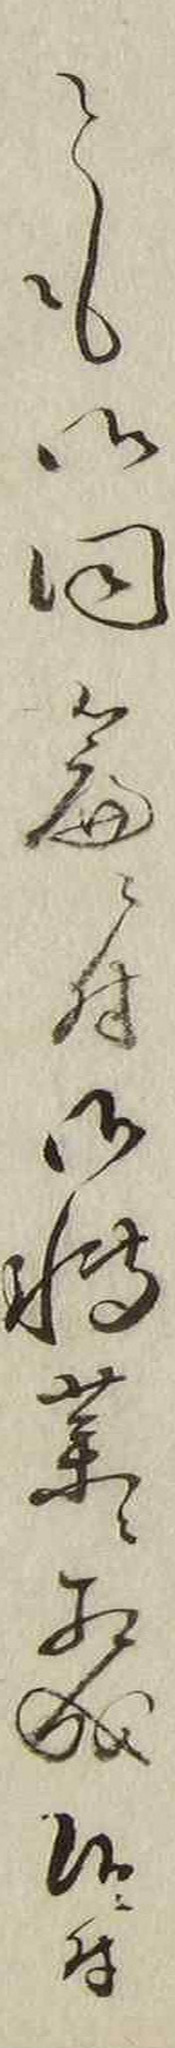とも御同篇ニ付御転薬ニ相成候ニ付
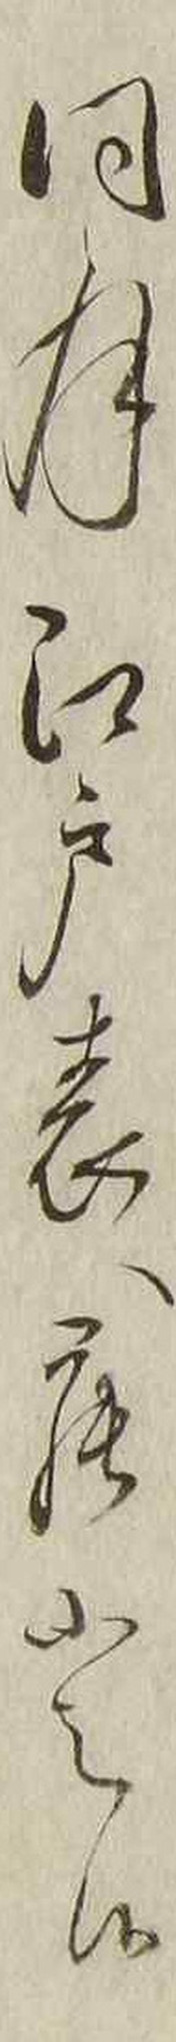同月江戸表へ罷登候

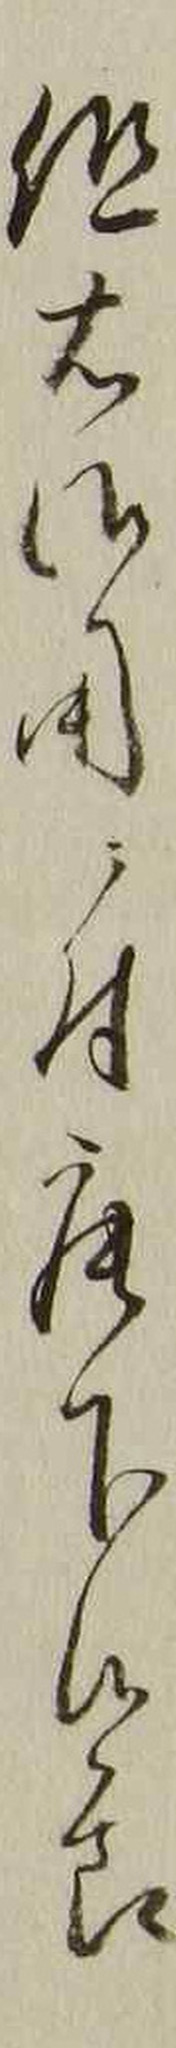但右御用ニ付罷下候節
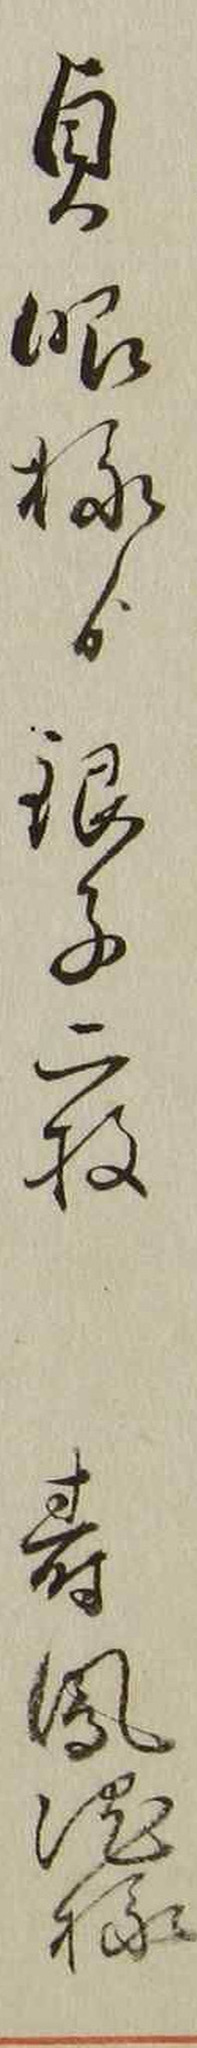貞昭様より銀子二枚寿鳳院様
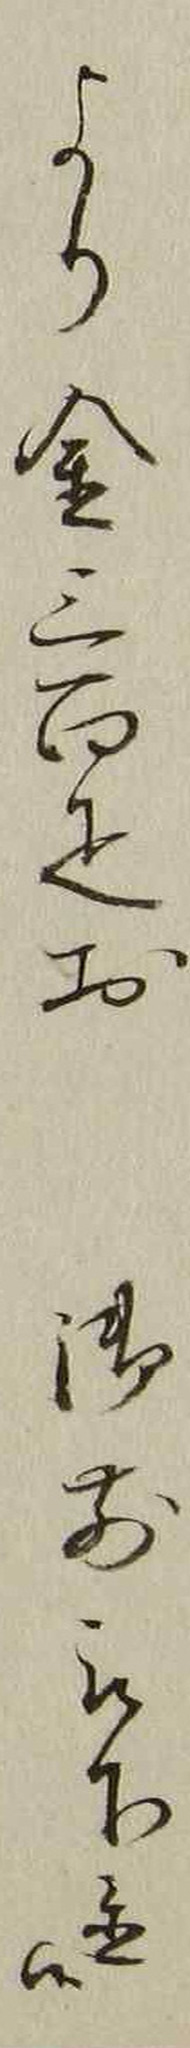より金三百疋於御前被下置候
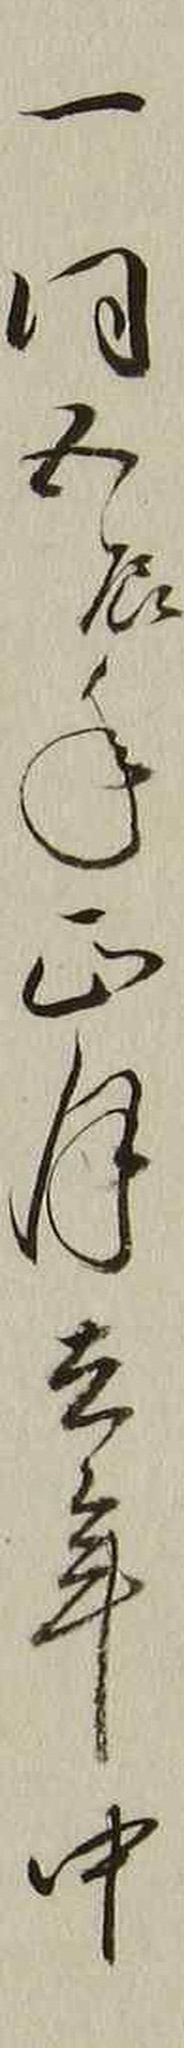一同五辰年正月去年中
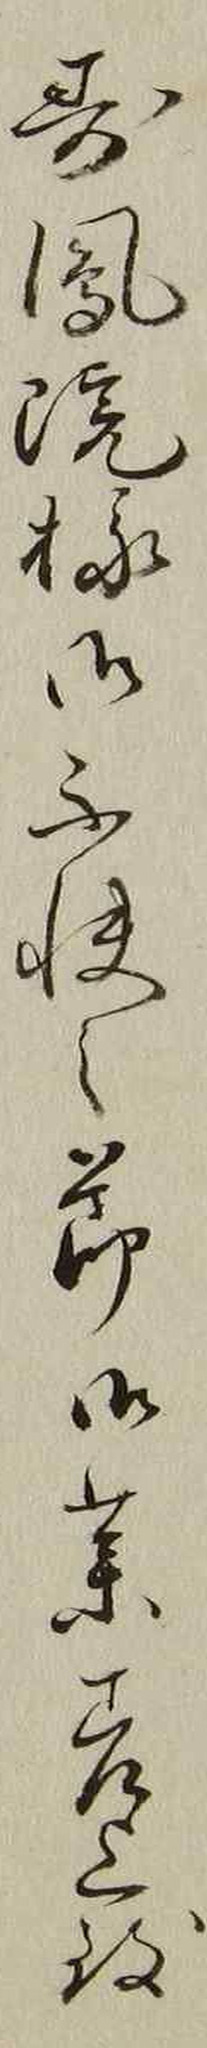寿鳳院様御不快之節御薬差上致
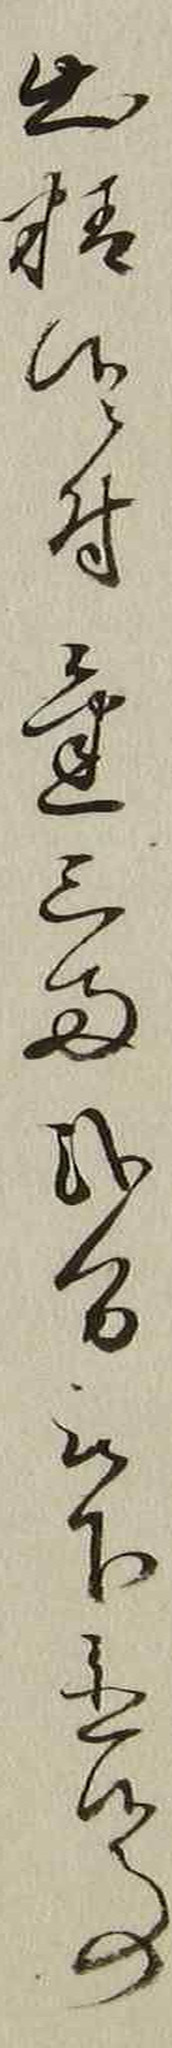出精候ニ付金三両弐分被下置候事
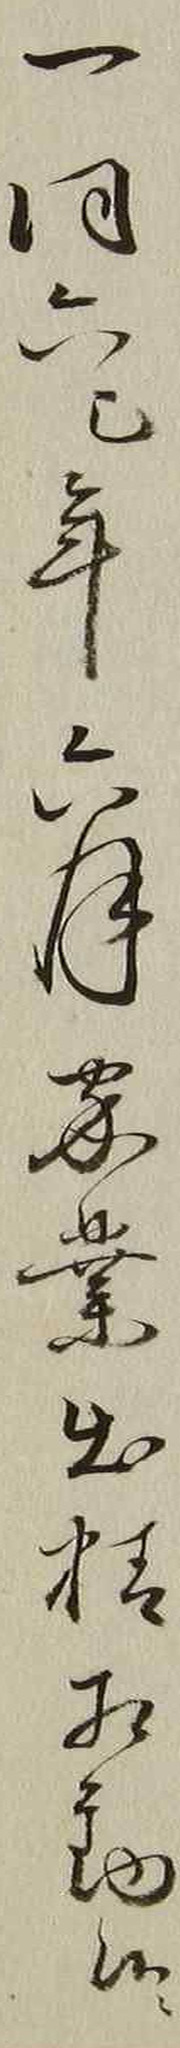一同六巳年六月家業出精相勤候ニ
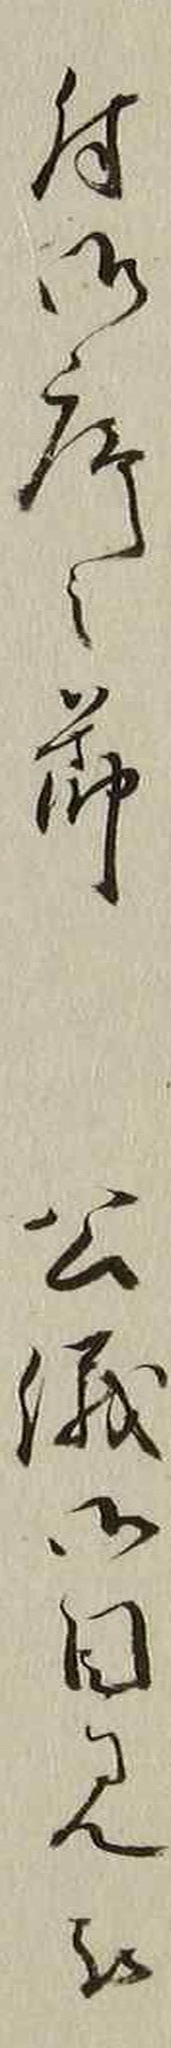付御序之節公儀御目見被
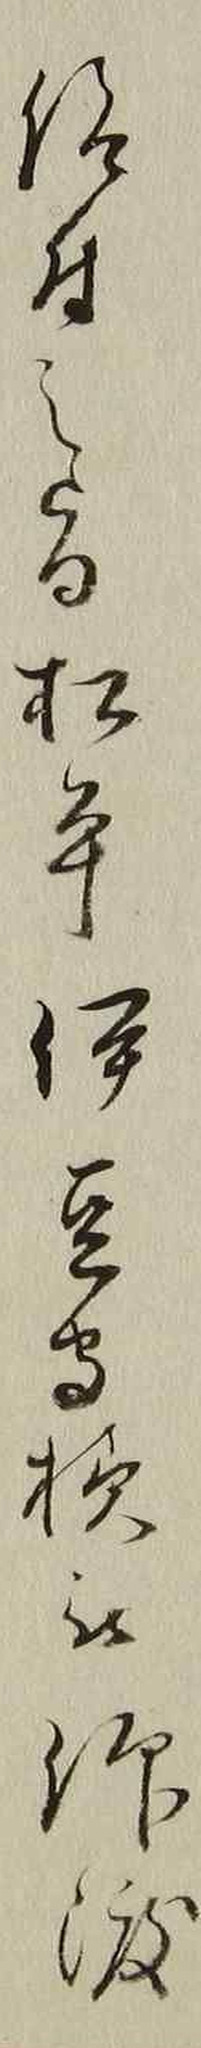仰付之旨松平伊豆守様被仰渡
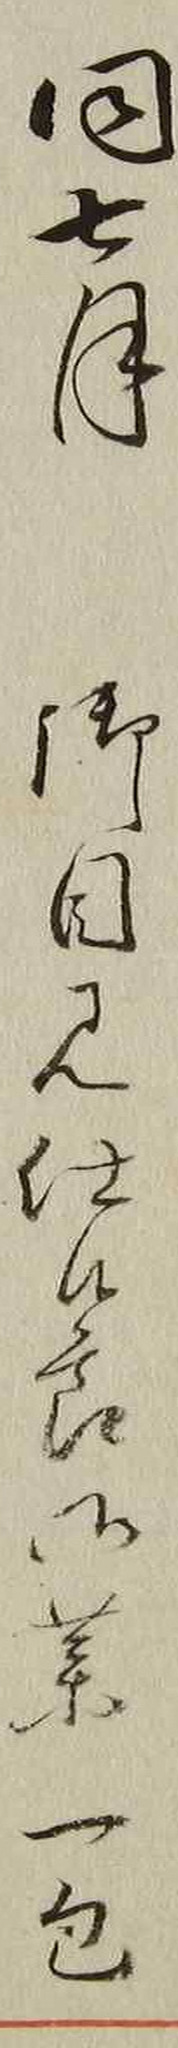同七月御目見仕候節御薬一包
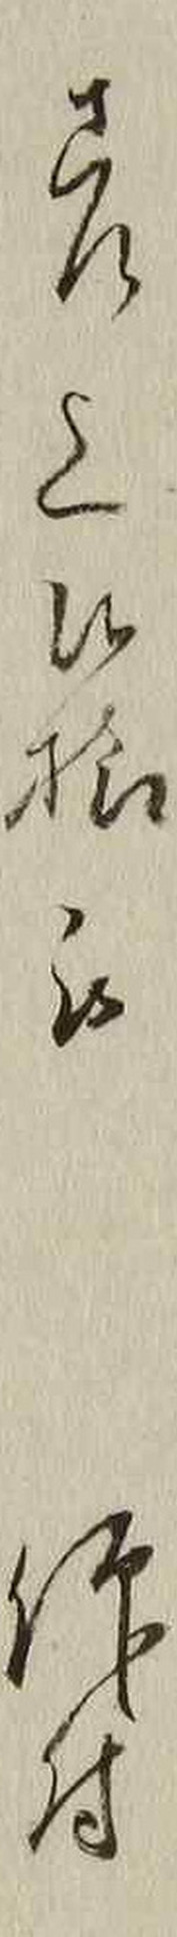差上候様被仰付
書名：諸士系譜　巻之8　い之部8
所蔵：会津若松市立会津図書館
